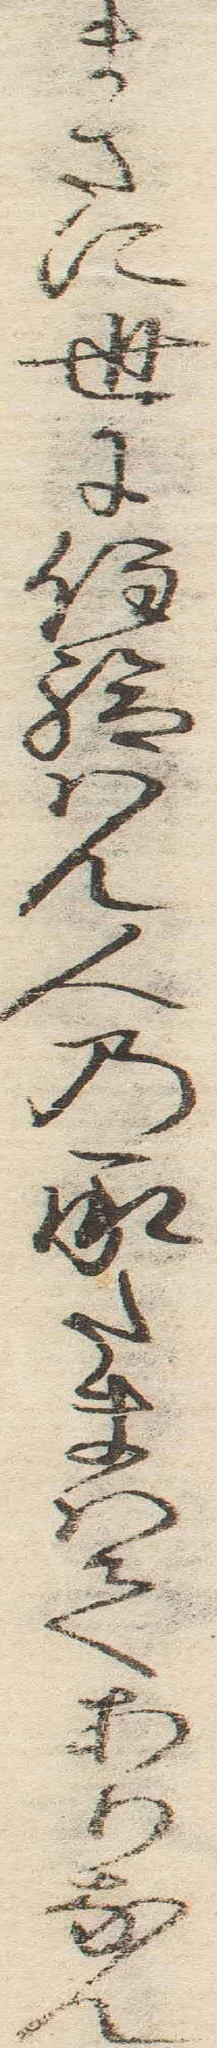まさに世に住給はん人の承たまはてありなん
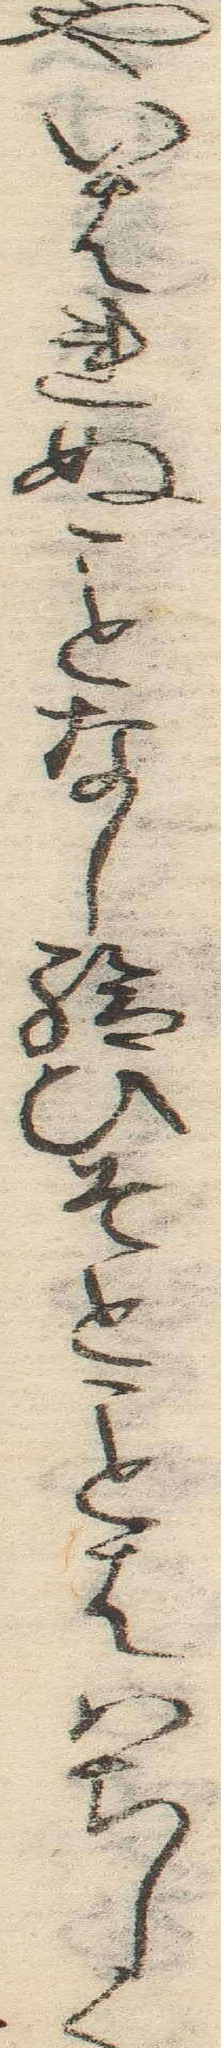やいはれぬことなし給ひそとことははちしく

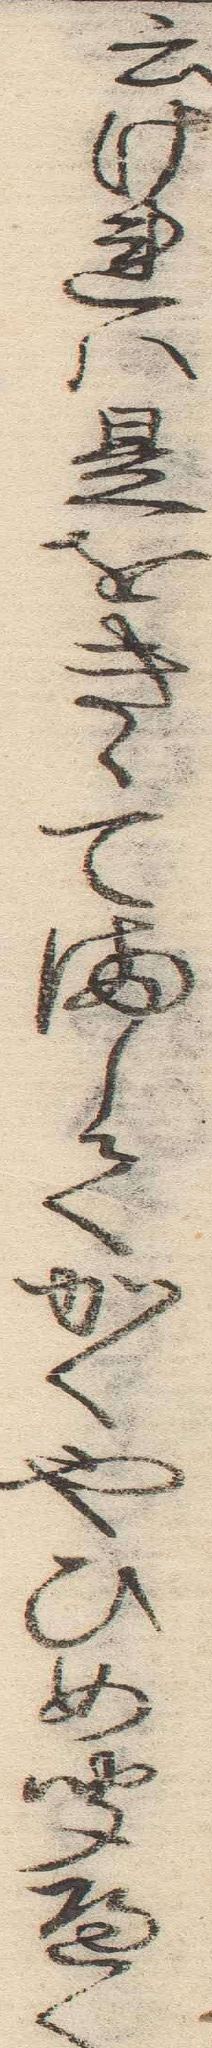云けれは是をきゝてましてかくやひめ聞へく
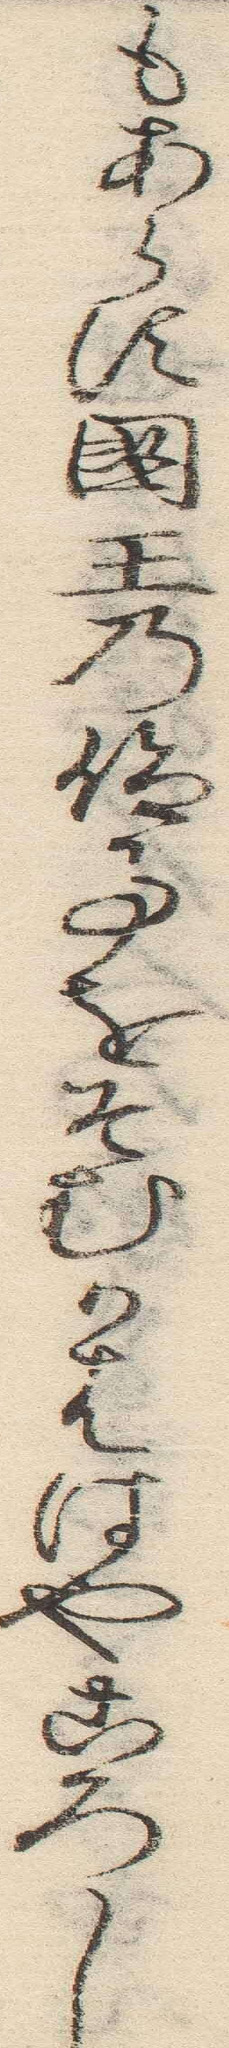もあらす国王の仰事をそむかははやころし
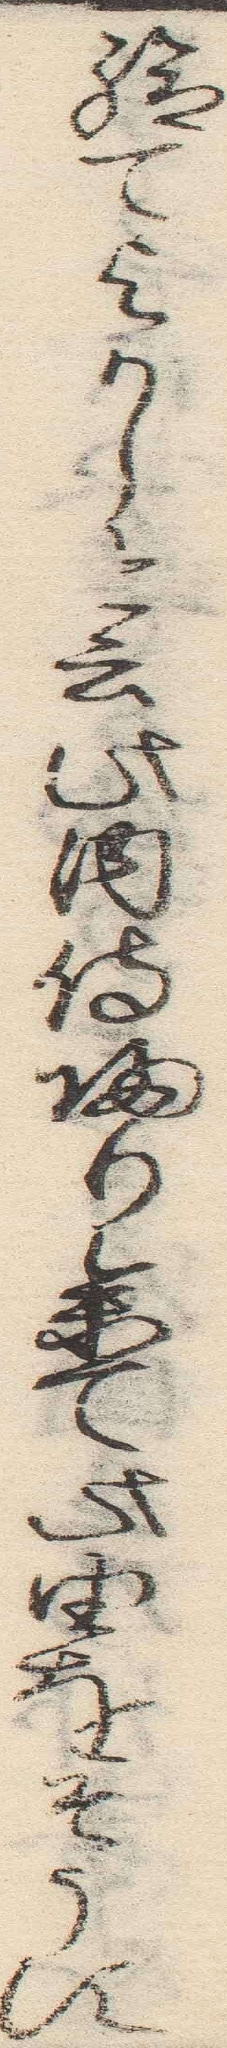給てよかしと云此内侍帰り参て此由をそうす
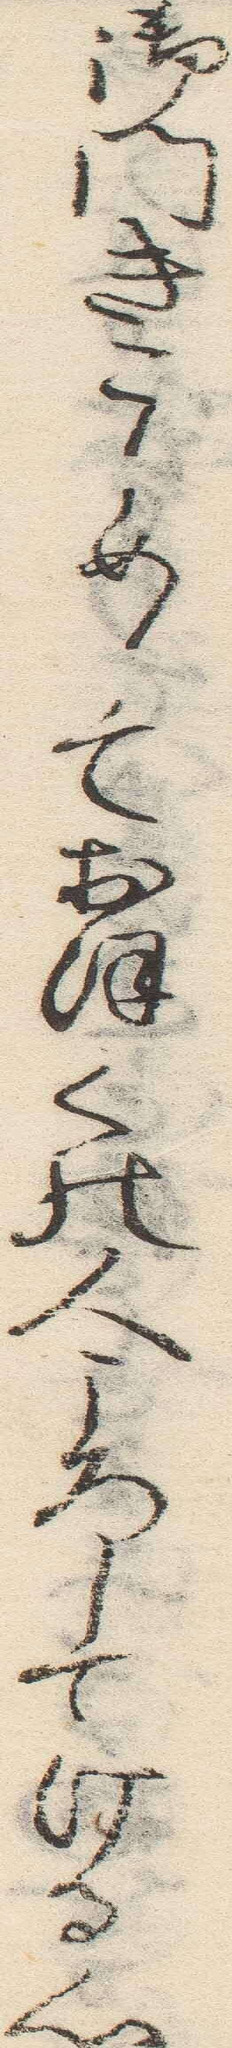御門きこしめしておほくの人ころしてける心
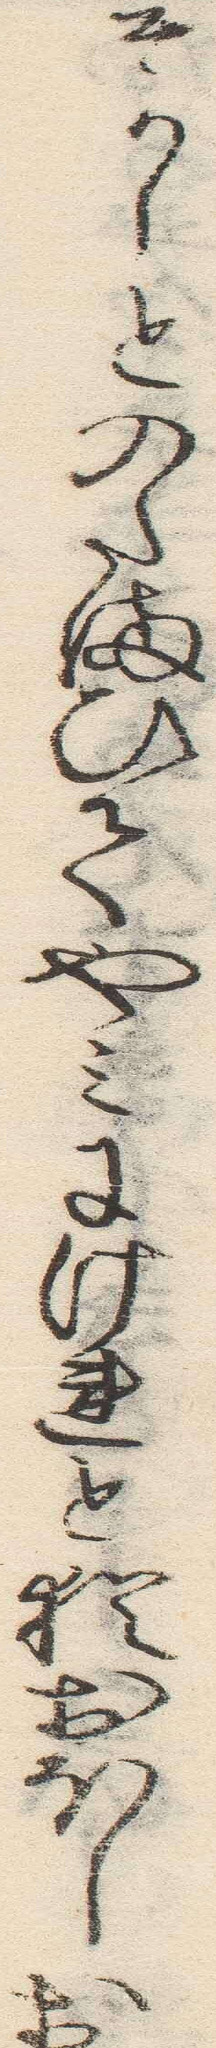そかしとのたまひてやみにけれと猶おほしお
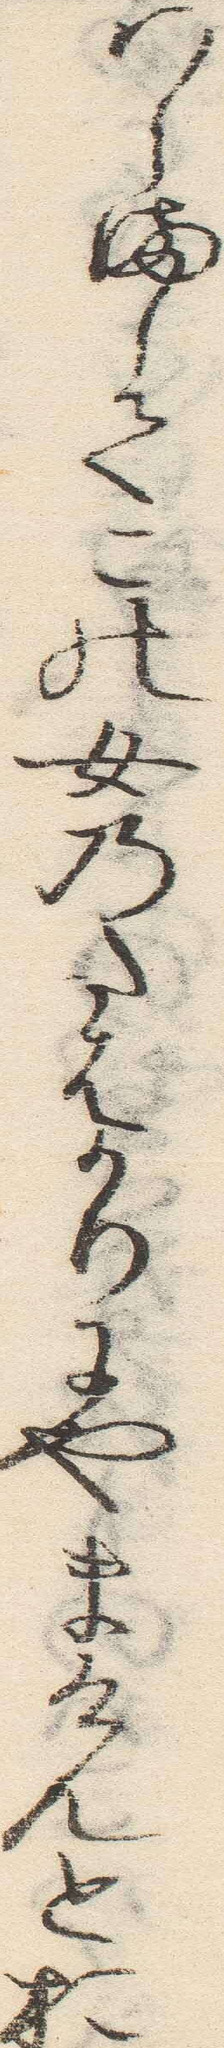はしましてこの女のたはかりにやまけんとお
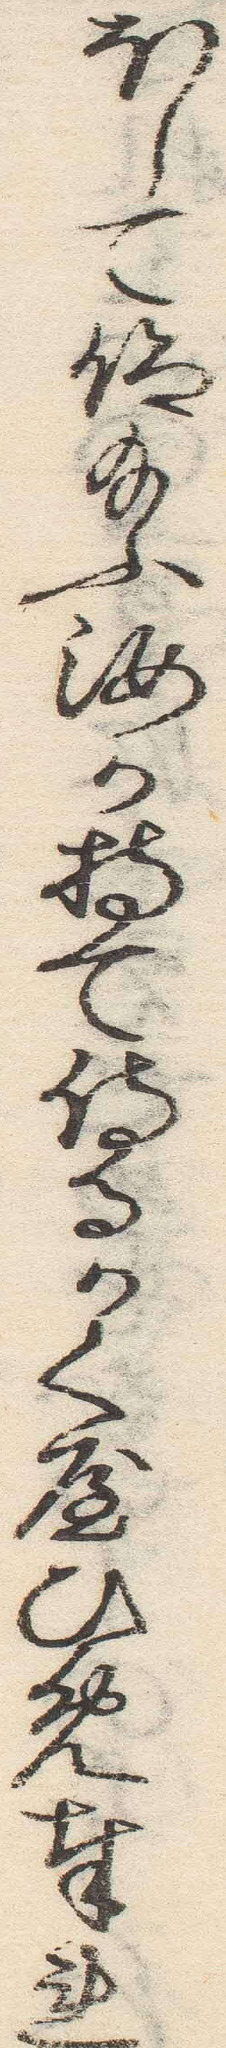ほして仰給ふ汝か持て侍るかくやひめ奉れ
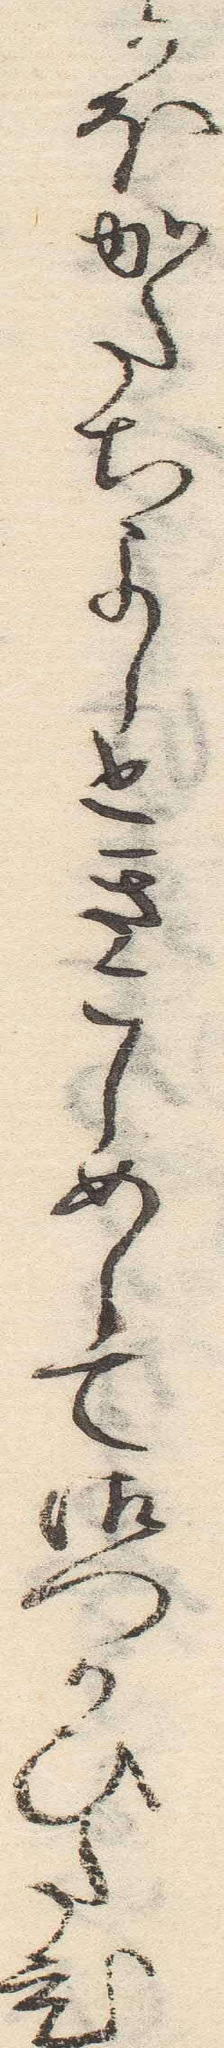かほかたちよしときこしめて御つかひたひ
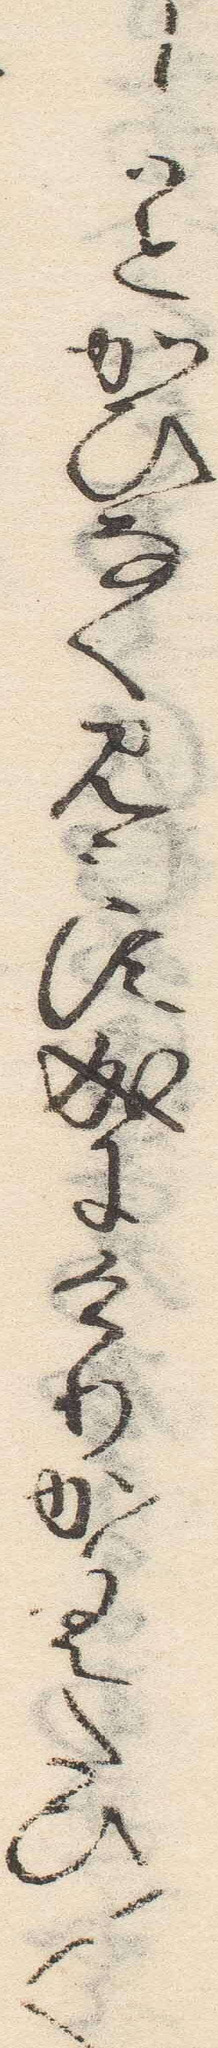しかとかひなく見えす成にけりかくたひ〳〵
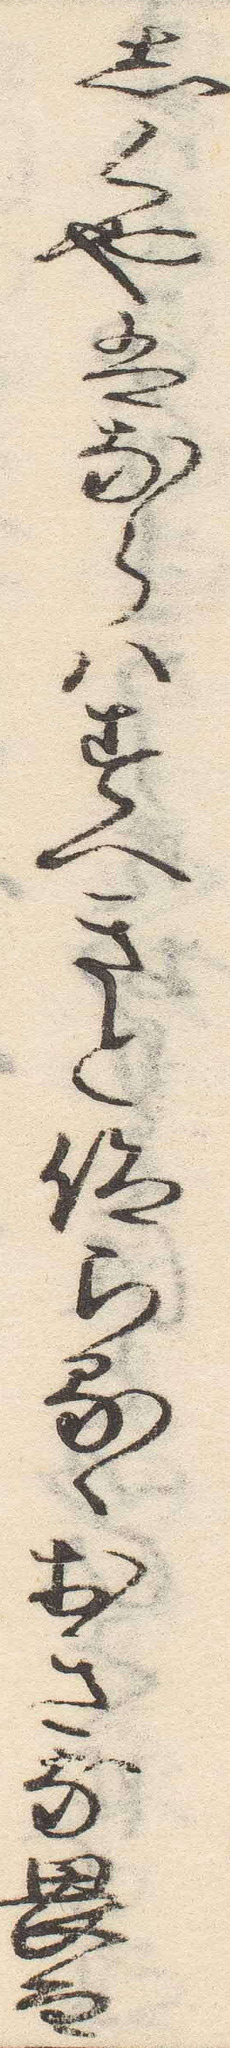しくやはならはすへきと仰らるゝおきな畏て
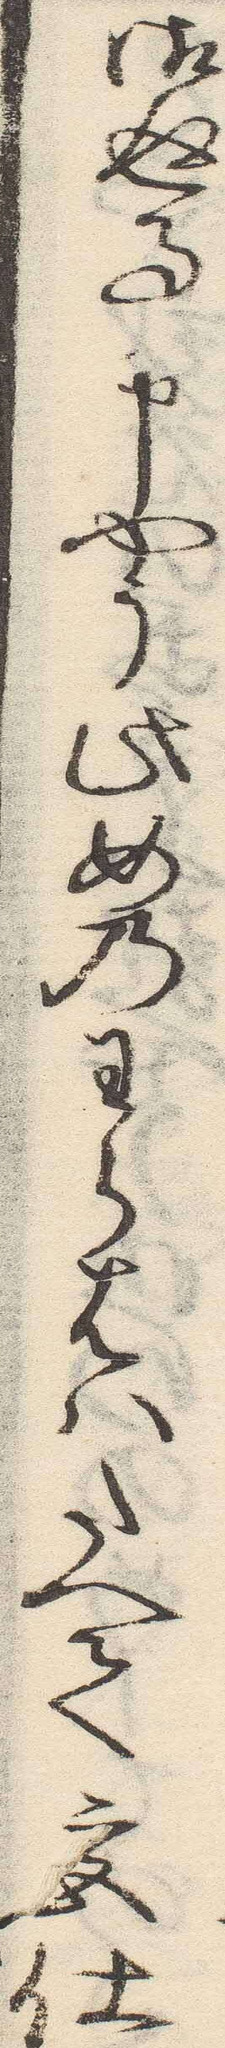御返事申やう此めのわらははたへて宮仕
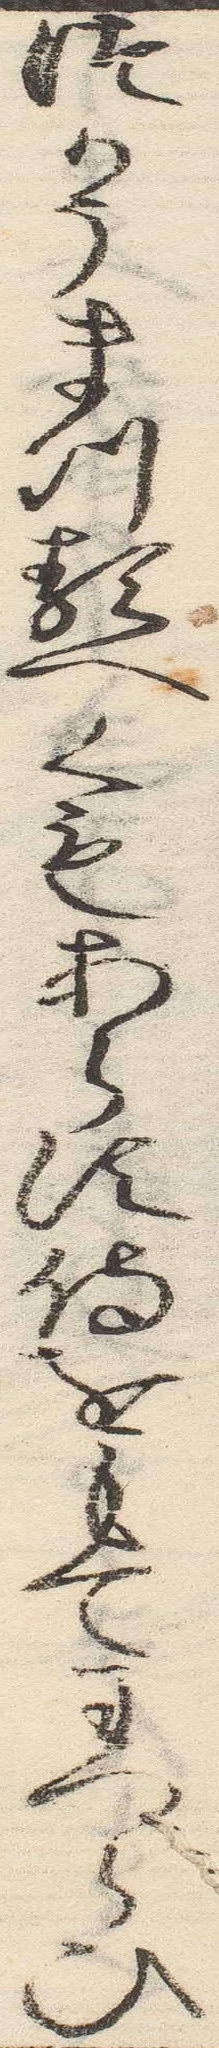つかうまつるへくもあらす侍をもてわつらひ
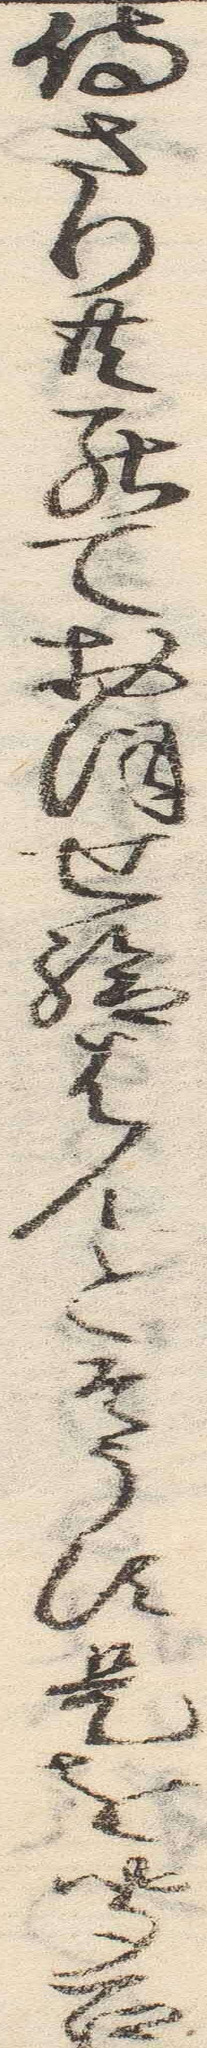侍さり共罷ておほせ給はんとそうす是を聞召
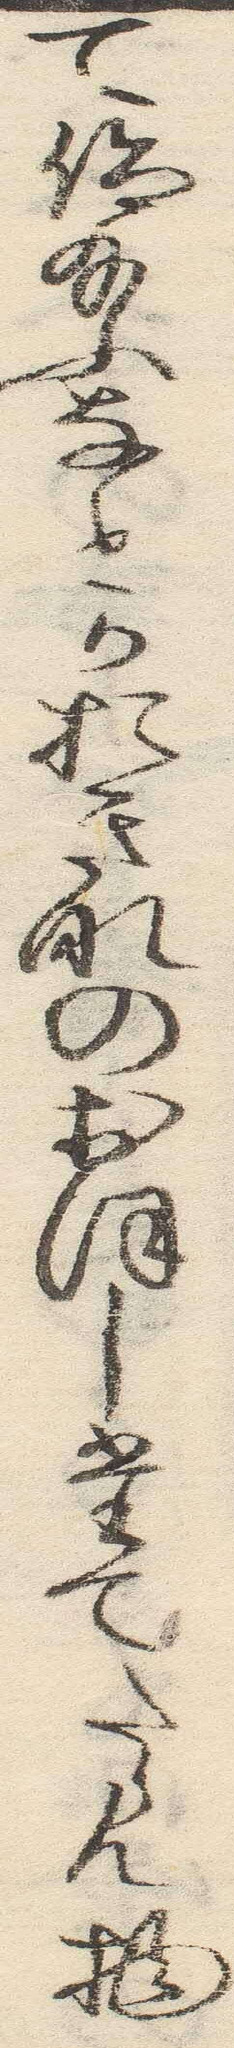て仰給ふなとかおきなのおほしたてたらん物
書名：竹取物語
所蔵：東京学芸大学附属図書館 国文学研究資料館
